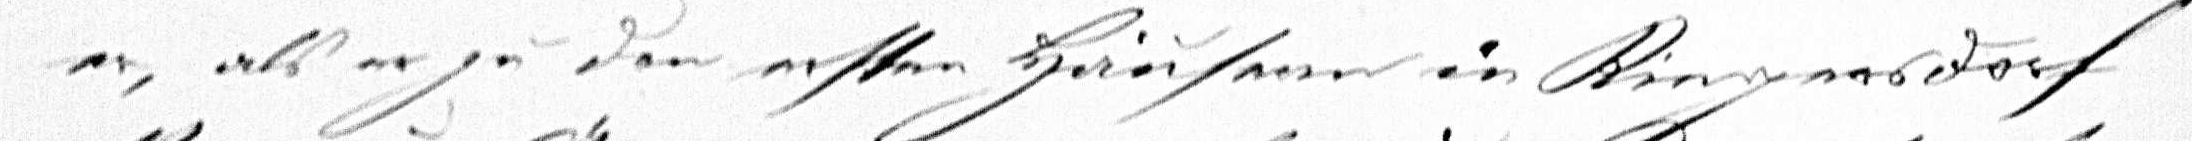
er, als er zu den ersten Häusern in Riegersdorf
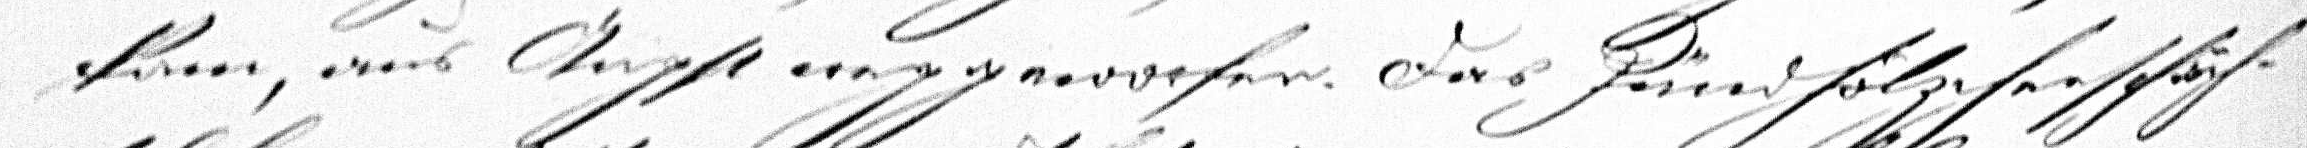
kam, aus Angst weggeworfen. Das Zündhölzchenschäch¬
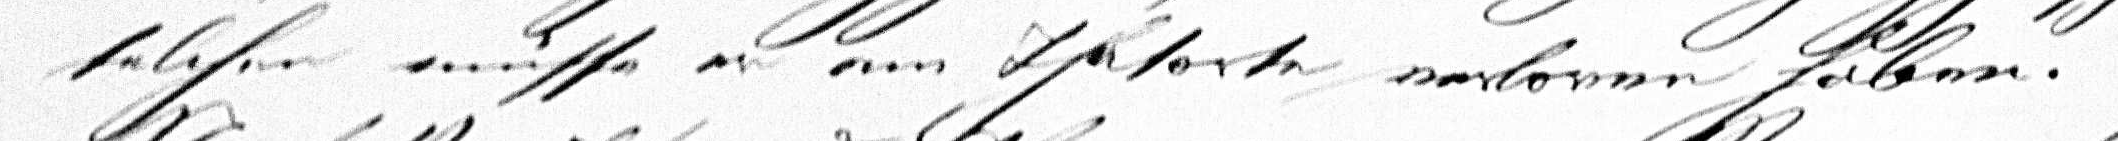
telchen müsse er am Thatorte, verloren haben.
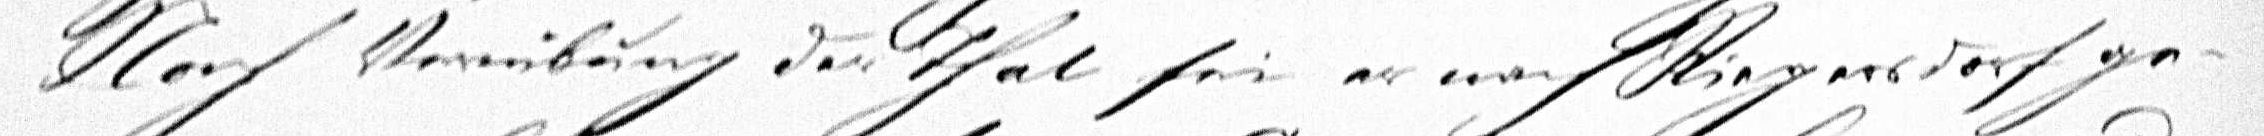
Noch Verübung der That sei er nach Riegersdorf ge¬
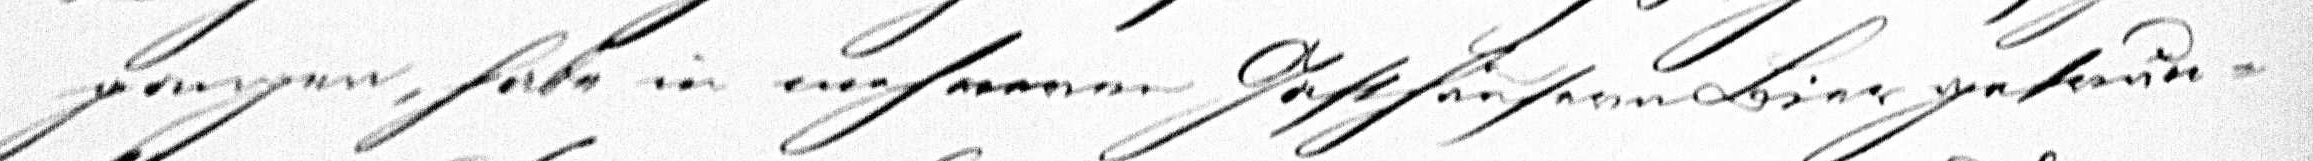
gangen, habe in mehreren Gasthäusern Bier getrun¬
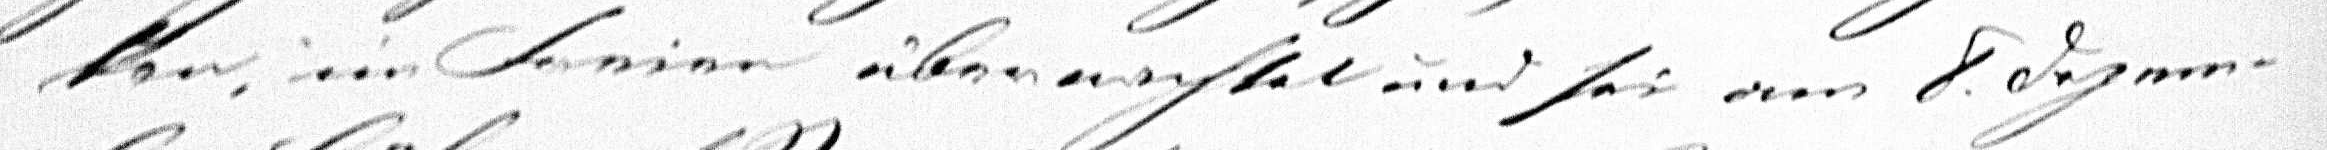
ken, im Freien übernachtet und sei am 8. Dezem¬
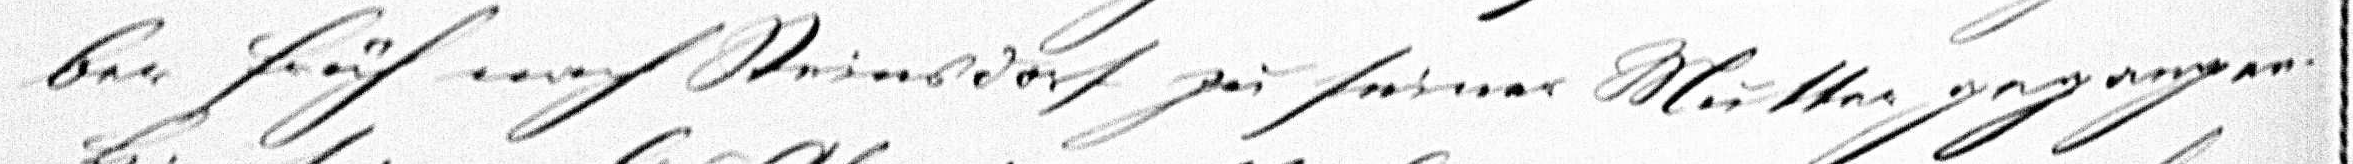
ber früh nach Steinsdorf zu seiner Mutter gegangen.
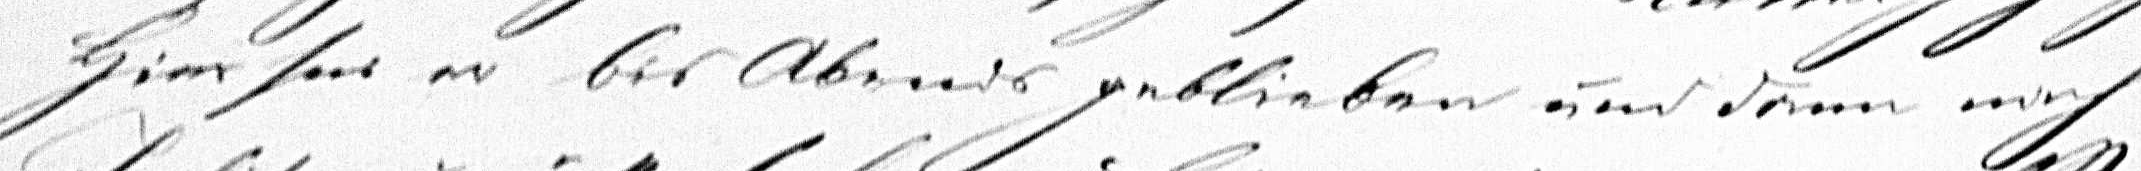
Hier hat er bis Abends geblieben und dann noch
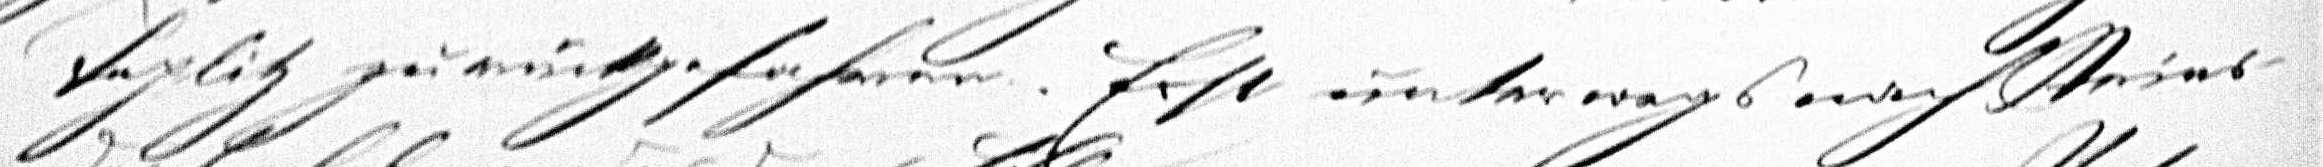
Teplitz zurückgefahren. Erst unterwegs nach Steins¬
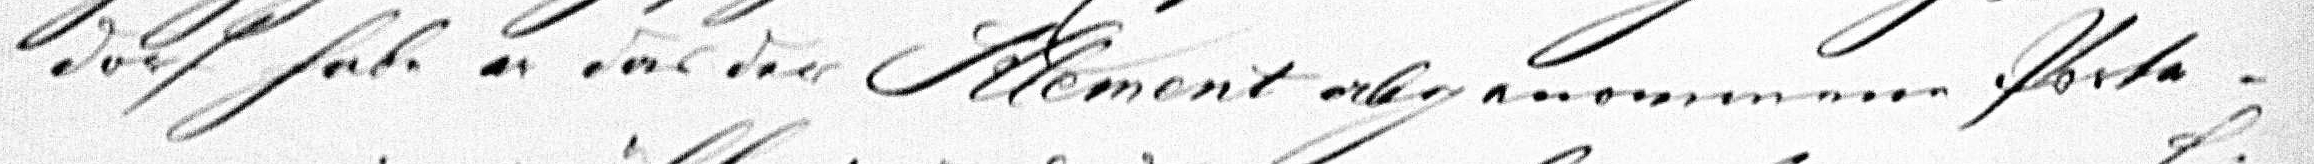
dorf habe er das der Klement abgenommene Porte¬
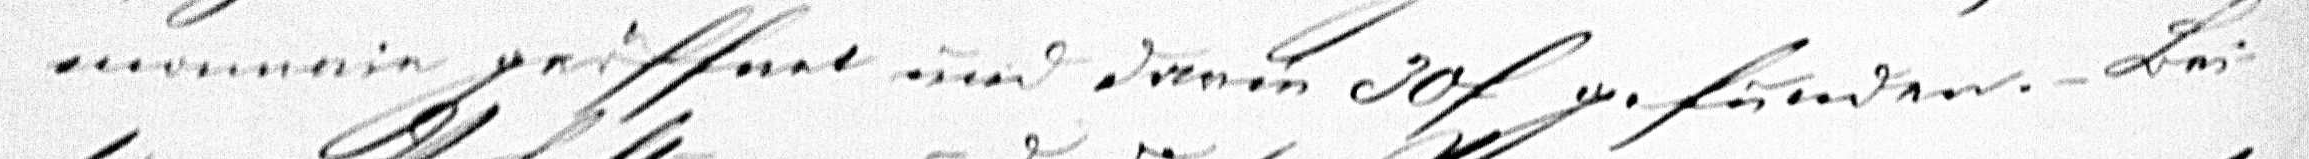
monnaie geöffnet und davon 30f gefunden. Bei
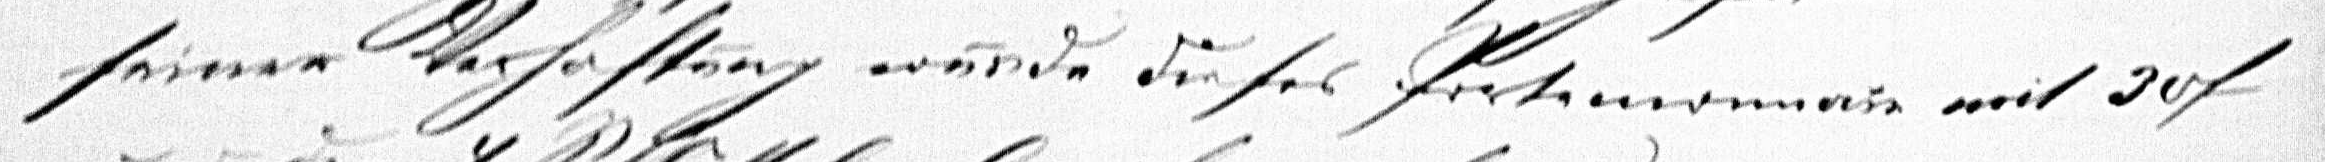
seiner Verhaftung wurde dieses Portemonnaie mit 30f
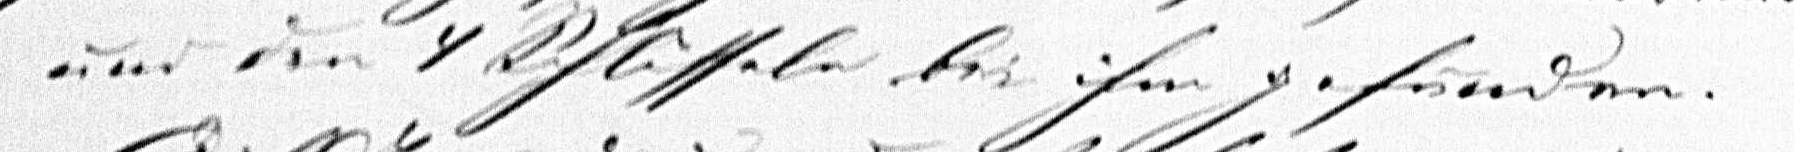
und die 4 Schlüsseln bei ihm gefunden.
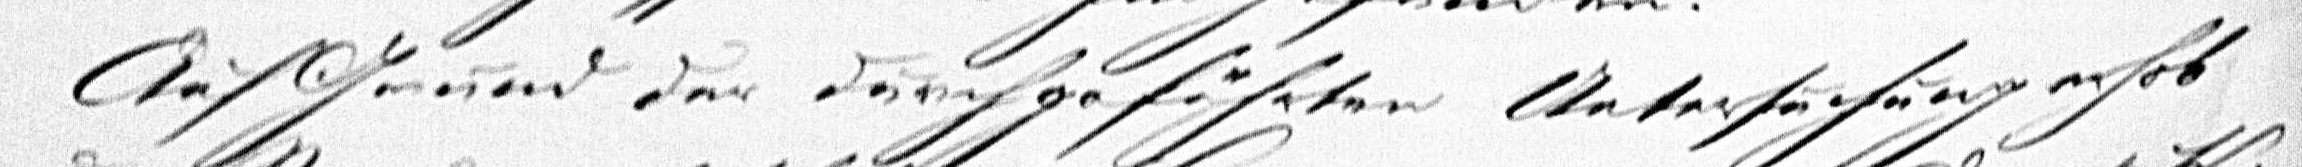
Auf Grund der durchgeführten Untersuchung erhob
